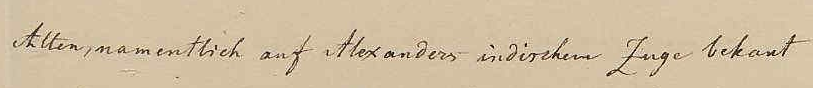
Alten, namentlich auf Alexanders indischem Zuge bekant
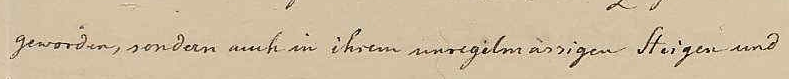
geworden, sondern auch in ihrem unregelmässigen Steigen und
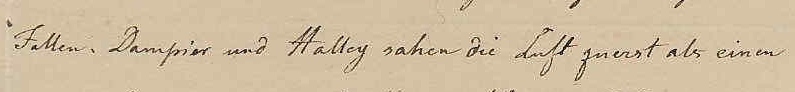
Fallen. Dampier und Halley sahen die Luft zuerst als einen
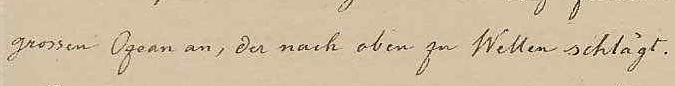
grossen Ozean an, der nach oben zu Wellen schlägt.
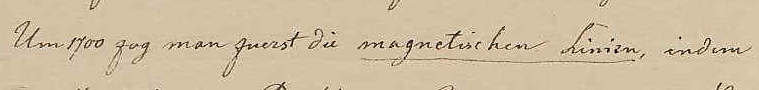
Um 1700 zog man zuerst die magnetischen Linien, indem
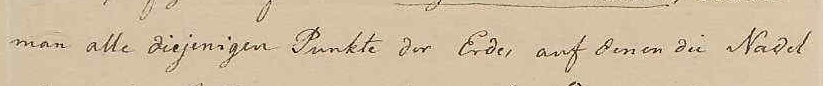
man alle diejenigen Punkte der Erde, auf denen die Nadel
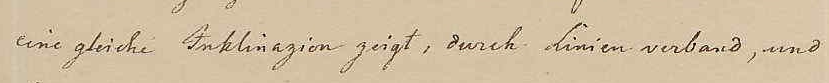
eine gleiche Inklinazion zeigt, durch Linien verband, und
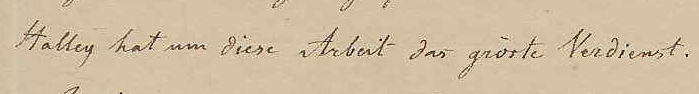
Halley hat um diese Arbeit das gröste Verdienst.
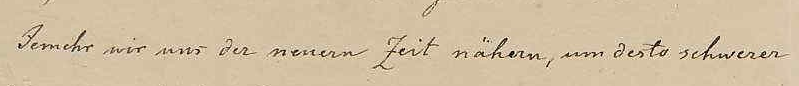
Jemehr wir uns der neuern Zeit nähern, um desto schwerer
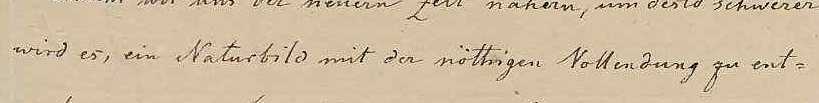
wird es, ein Naturbild mit der nöthigen Vollendung zu ent-
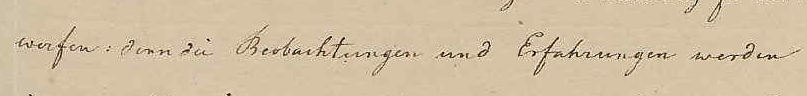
werfen: denn die Beobachtungen und Erfahrungen werden
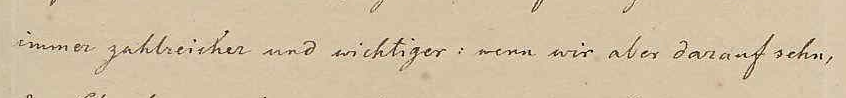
immer zahlreicher und wichtiger: wenn wir aber darauf sehn,
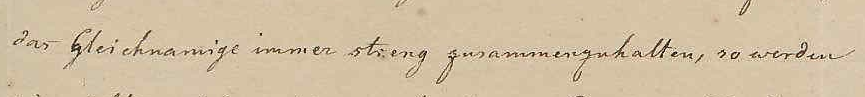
das Gleichnamige immer streng zusammenzuhalten, so werden
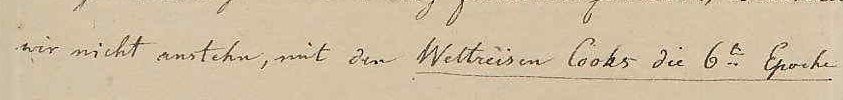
wir nicht anstehn, mit den Weltreisen Cooks die 6￼ Epoche
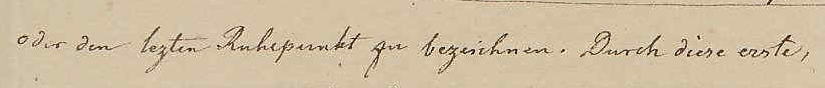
oder den lezten Ruhepunkt zu bezeichnen. Durch diese erste,
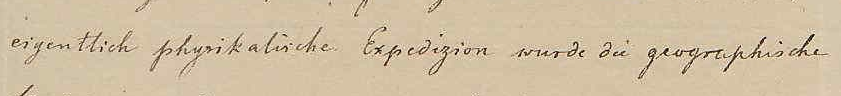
eigentlich physikalische Expedizion wurde die geographische
